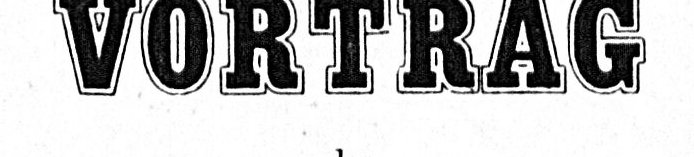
VORTRAG
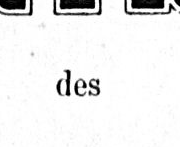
des
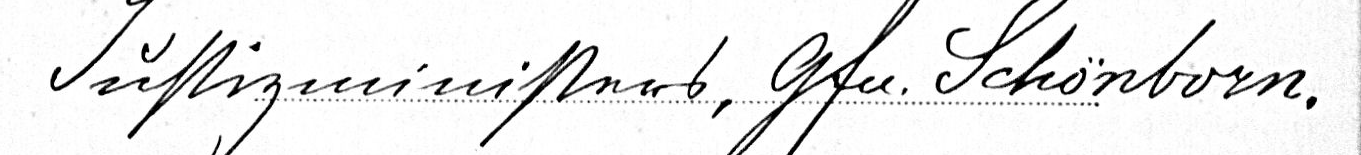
Justizministers, Gfn. Schönborn.
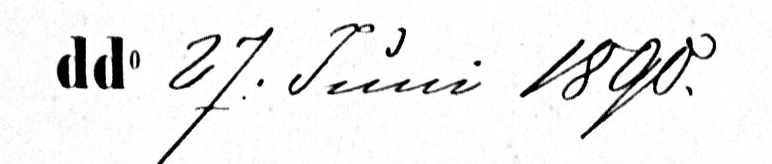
dd° 27. Juni 1890.
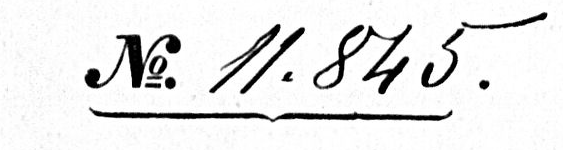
Nr. 11.845.
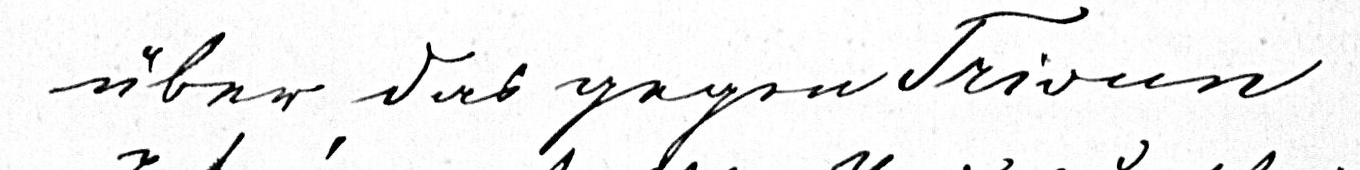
über das gegen Trivun
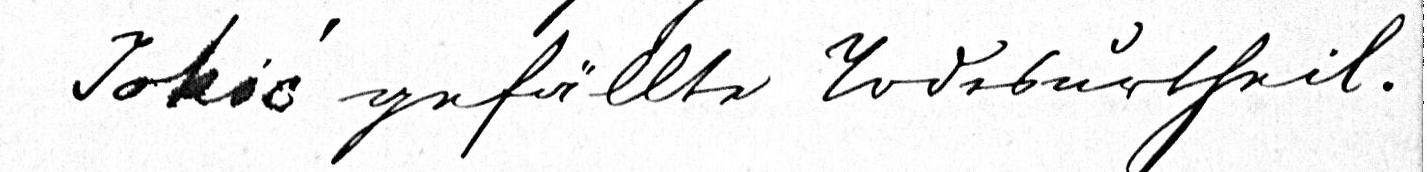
Jokić gefällte Todesurtheil.
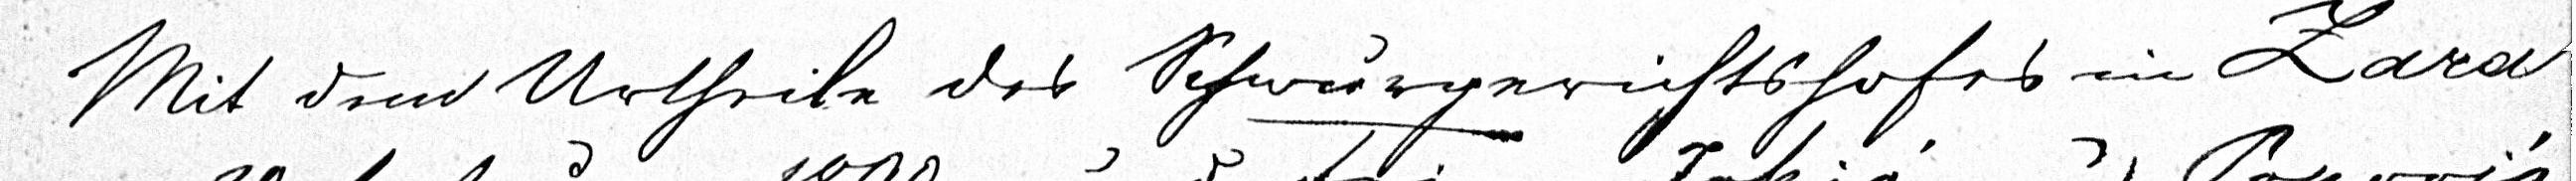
Mit dem Urtheile des Schwurgerichtshofes in Zara
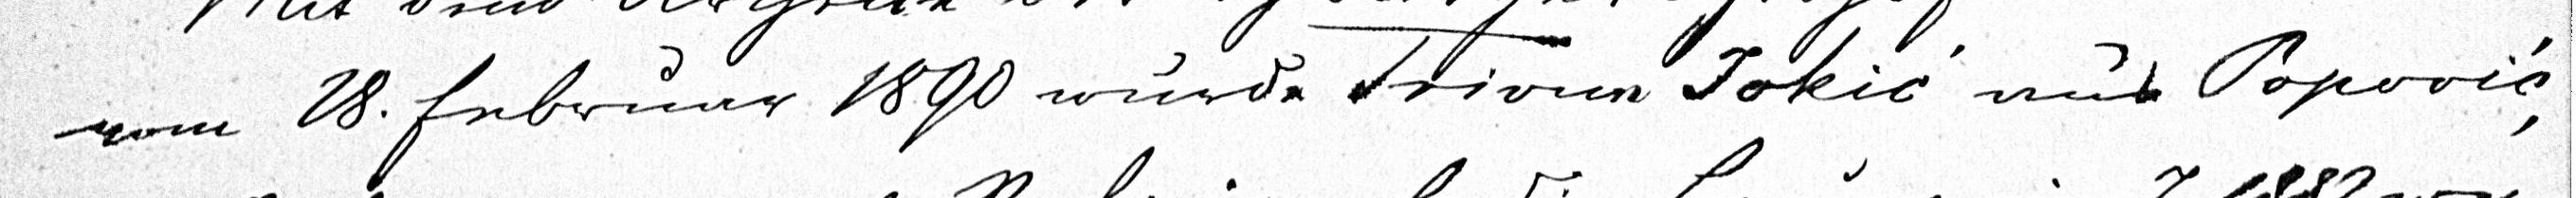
vom 28. Februar wurde Trivun Jokić aus Popović,
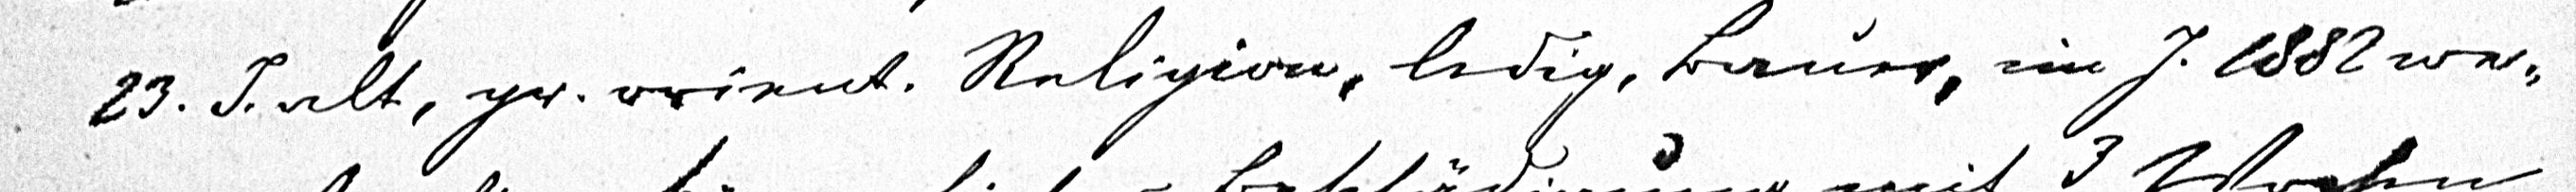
23. J. alt, gr. orient. Religion, ledig, Bauer, im J. 1882 we¬
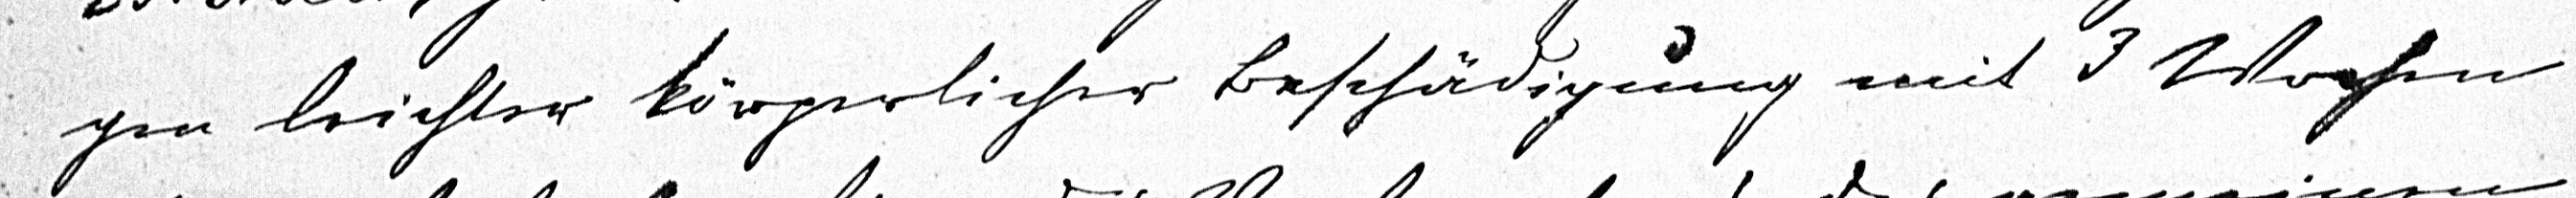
gen leichter körperlicher Beschädigung mit 3 Wochen
